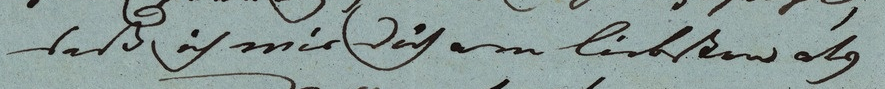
daß ich mir dich am liebsten als
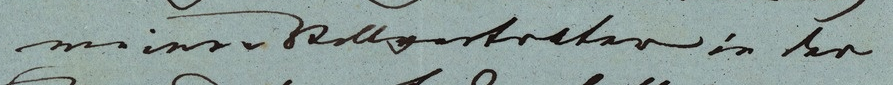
meinen Stellvertreter in der
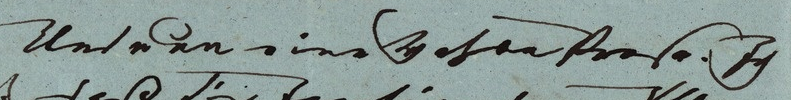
Und nun eine wahre Prosa. Ich
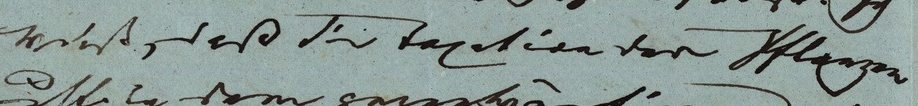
weiß, daß die Taxation der Pflanzen
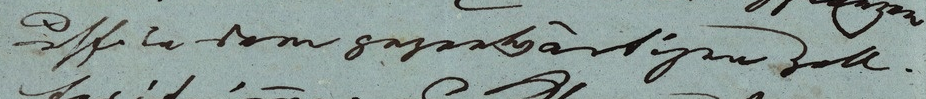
usf. in dem gegenwärtigen Zoll-
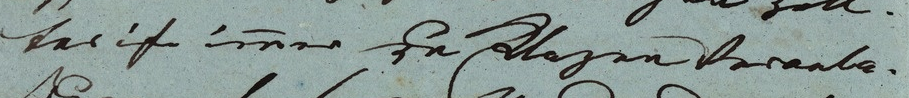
tarife immer zu Klagen Veranla-
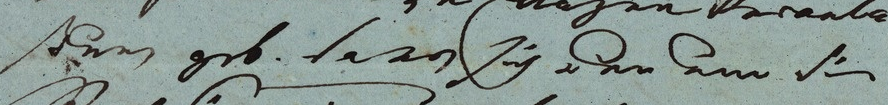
ßung gab. Da es sich nun um die
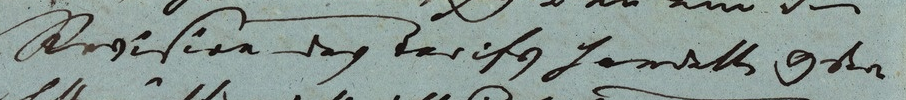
Revision des Tarifs handelt, & der-
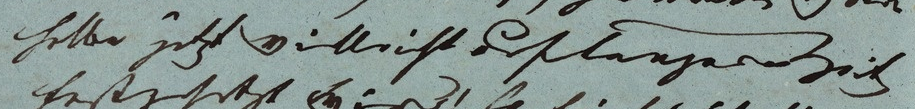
selbe jetzt vielleicht auf längere Zeit
